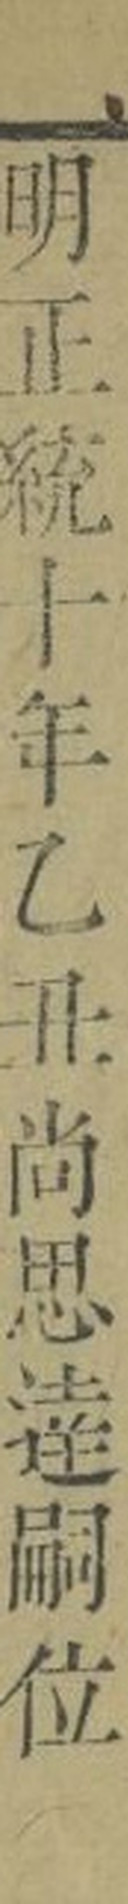明正統十年乙丑尚思達嗣位
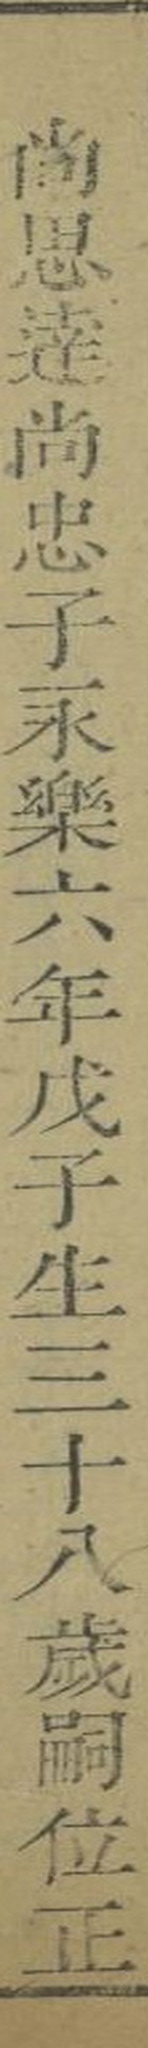尚思達尚忠子永楽六年戌子生三十八歳嗣位正
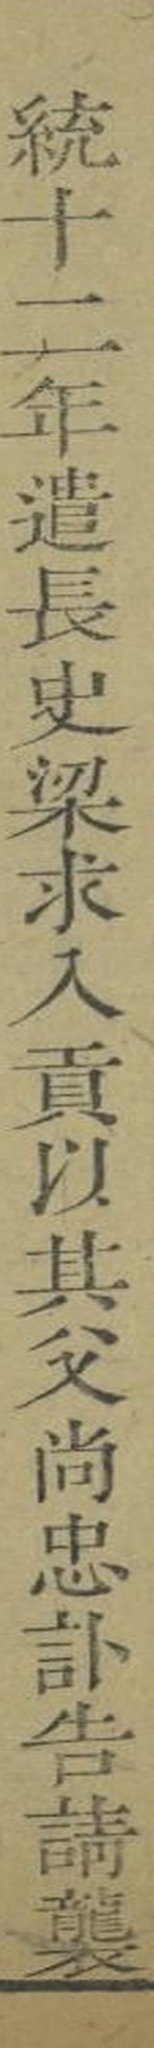統十二年遣長史梁求入貢以其父尚忠訃告請襲
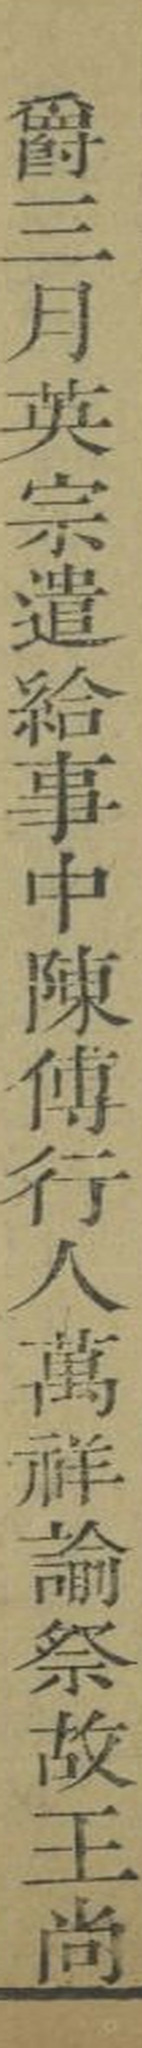爵三月英宗遣給事中陳傅行人万祥諭祭故王尚
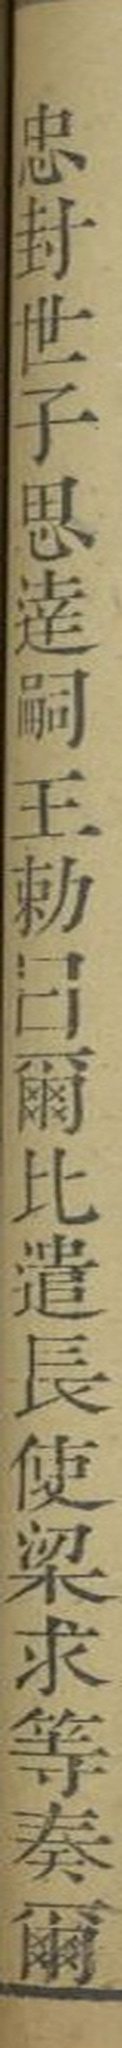忠封世子思達嗣王勅曰爾比遣長使梁求等奏爾
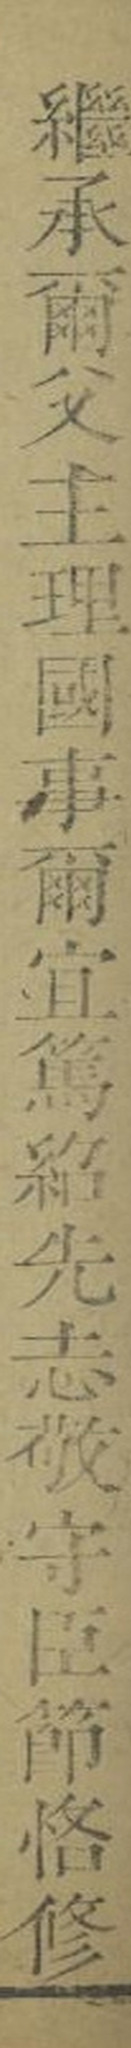継承爾父主理国事爾宜篤紹先志敬守臣節恪修
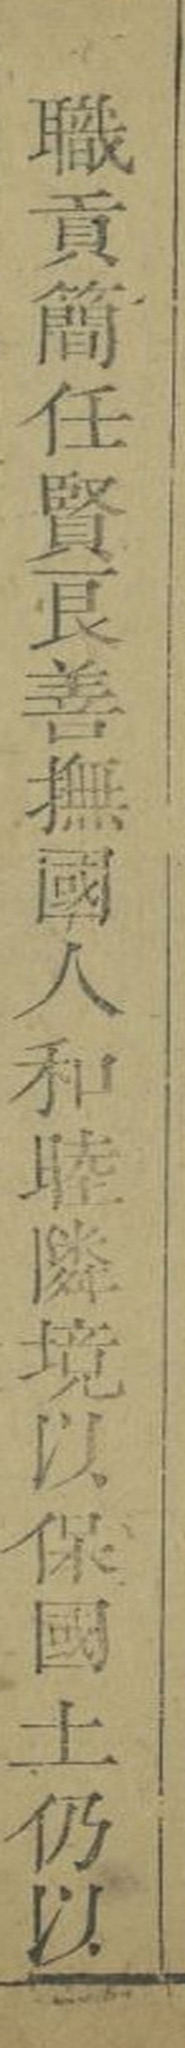職貢簡任賢良善撫国人和睦隣境以保国土仍以
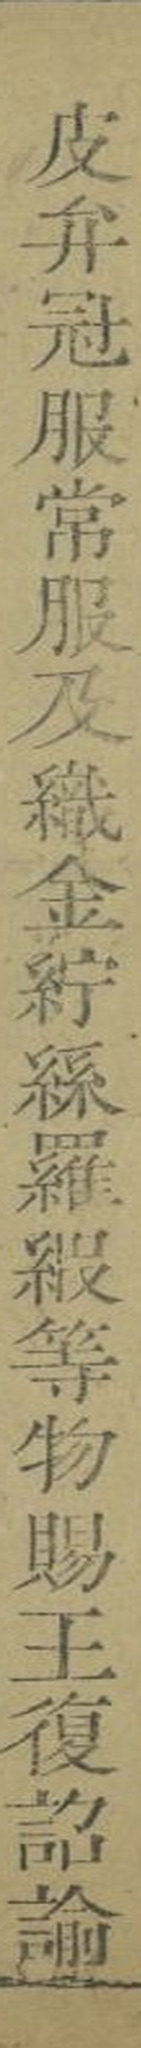皮弁冠服常服及織金紵糸羅緞等物賜王復詔諭
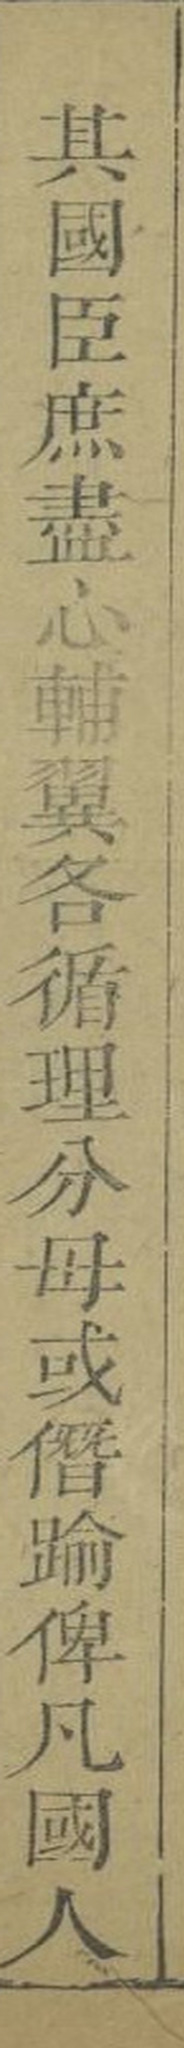其国臣庶尽心輔翼各循理分母或僭踰俾凡国人
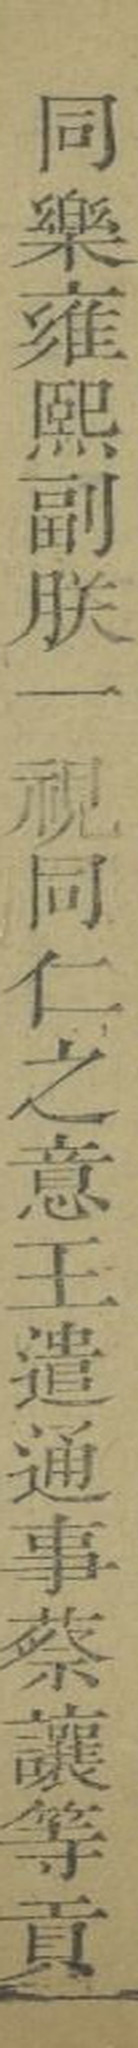同楽雍熙副朕一視同仁之意王遣通事蔡譲等貢
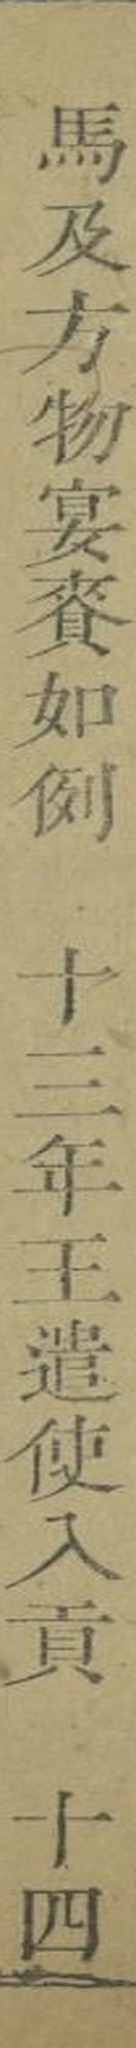馬及方物宴賚如例十三年王遣使入貢十四
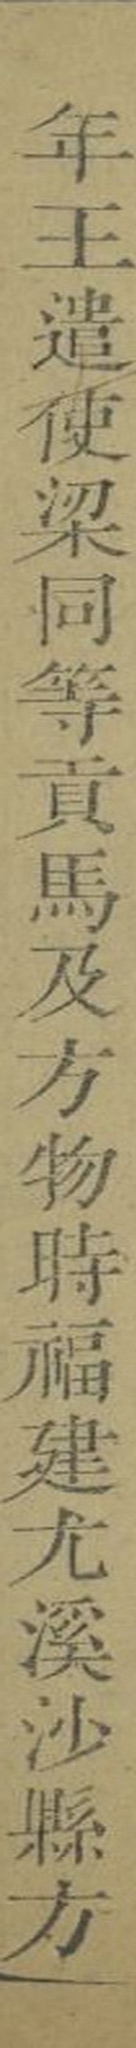年王遣使梁同等貢馬及方物時福建尤渓沙県方
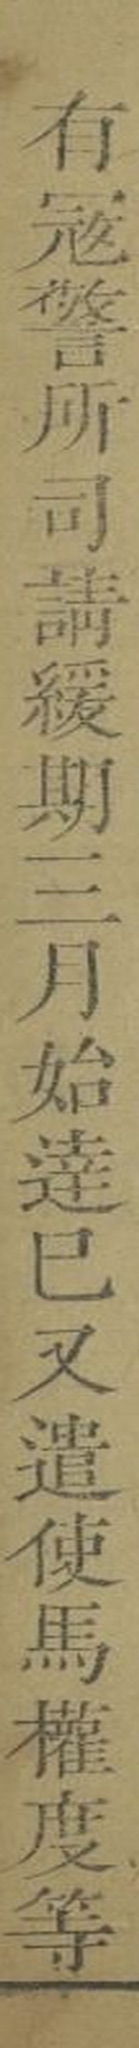有寇警所司請緩期三月始達巳又遣使馬権度等

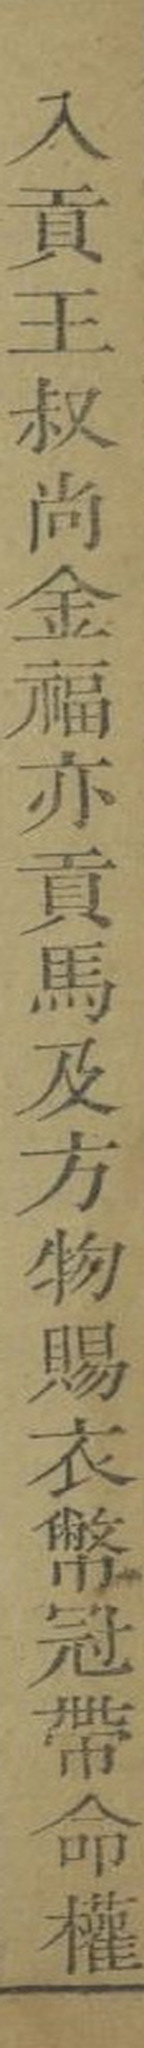入貢王叔尚金福亦貢馬及方物賜衣幣冠帯命権
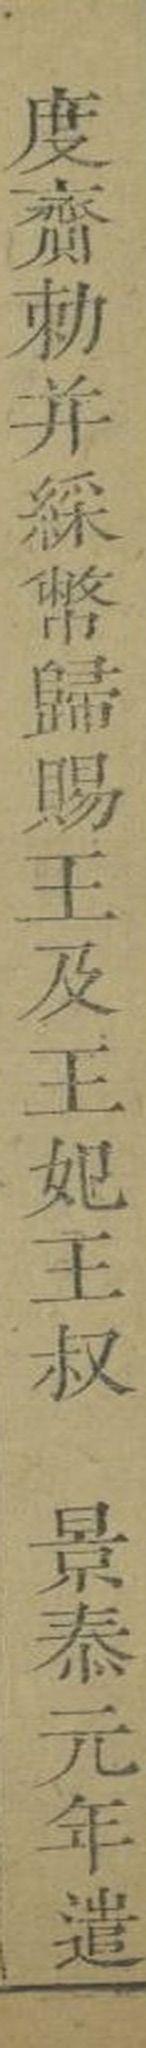度齎勅并綵幣帰賜王及王妃王叔景泰元年遣
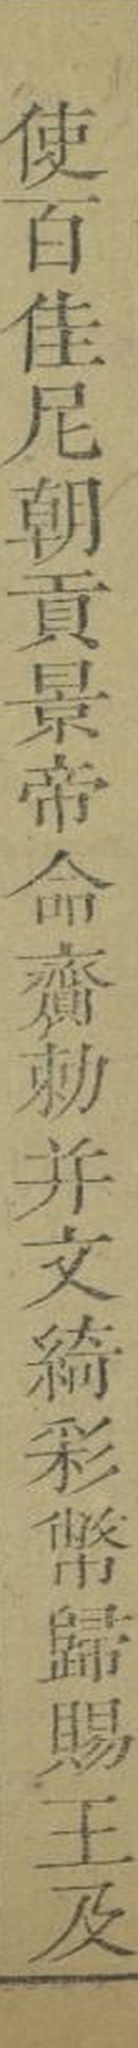使百佳尼朝貢景帝命齎勅并文綺彩幣帰賜王及
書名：中山伝信録 巻三
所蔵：University of the Ryukyus Library
